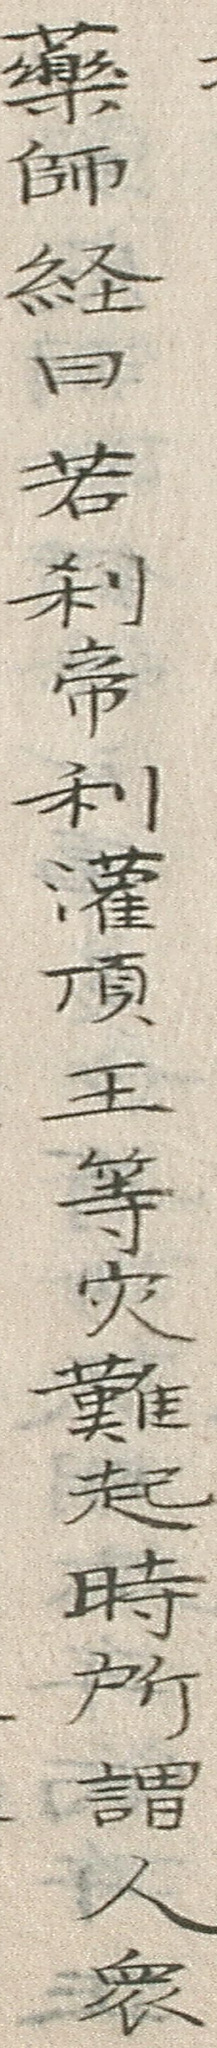薬師経曰若利帝利灌頂王等災難起時所謂人衆
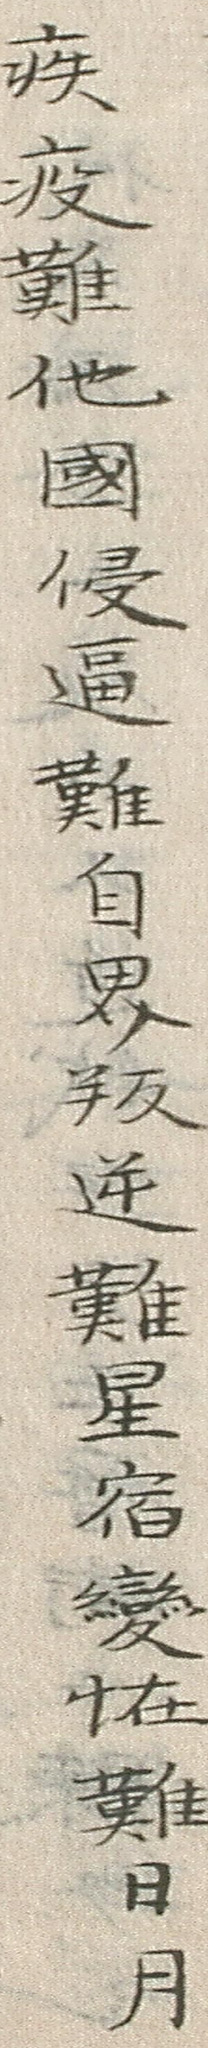疾疫難也国侵逼難自界叛逆難星宿変恠難日月
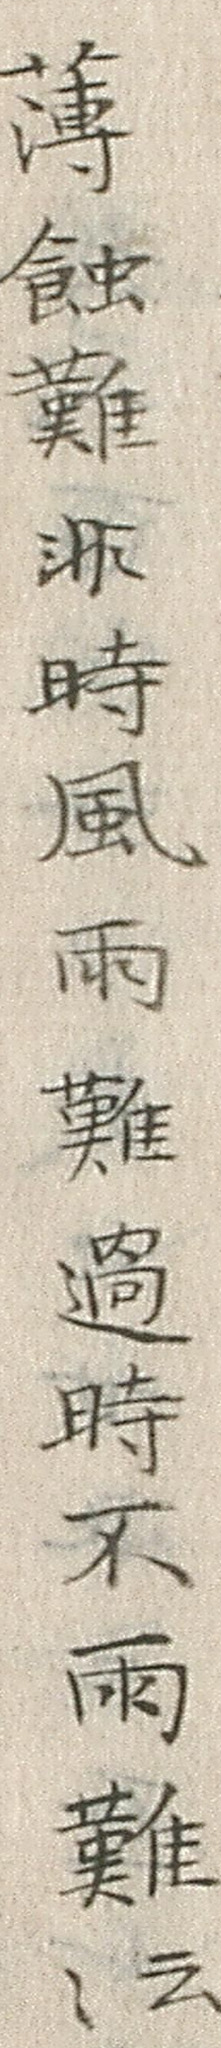薄蝕難非時風雨難過時不雨難云〻
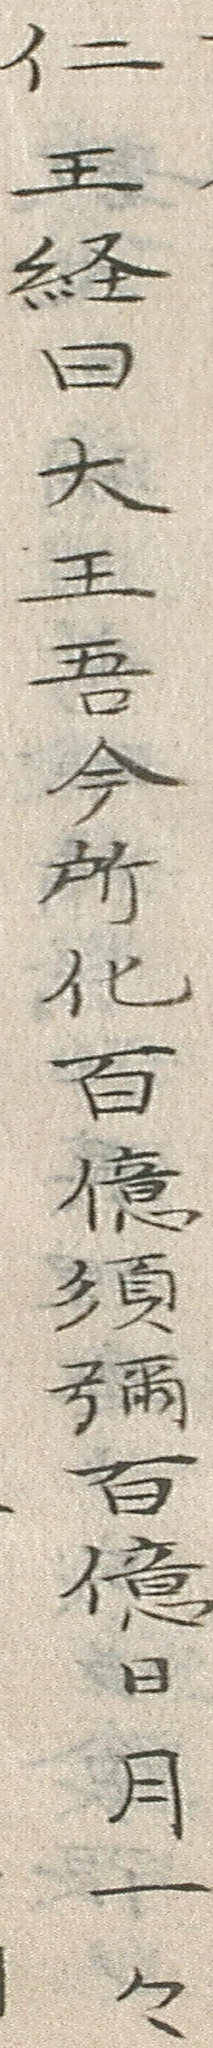仁王経曰大王吾今所化百億須弥百億日月一々
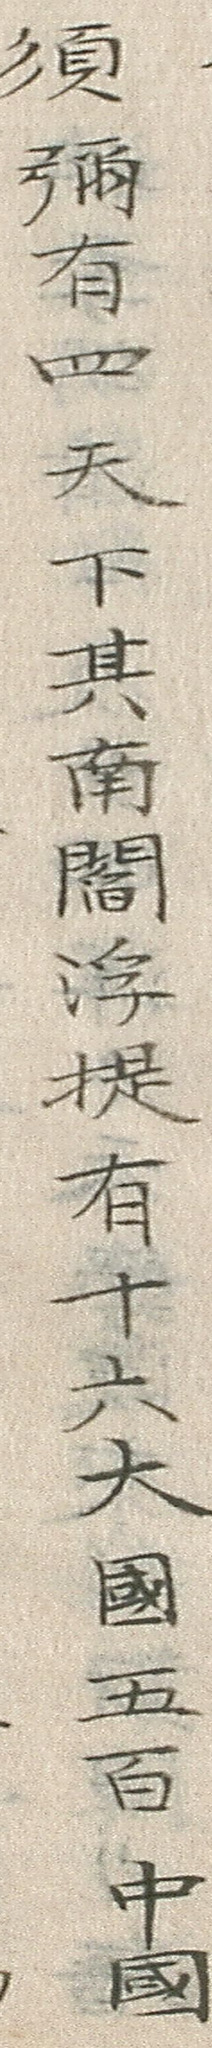須弥有四天下其南閻浮提有十六大国五百中国
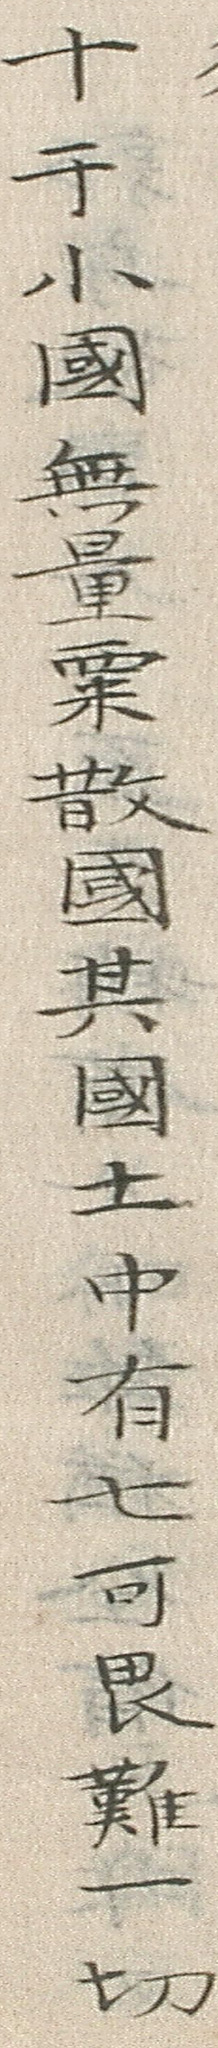十千小国無量粟散国其国土中有七可畏難一切
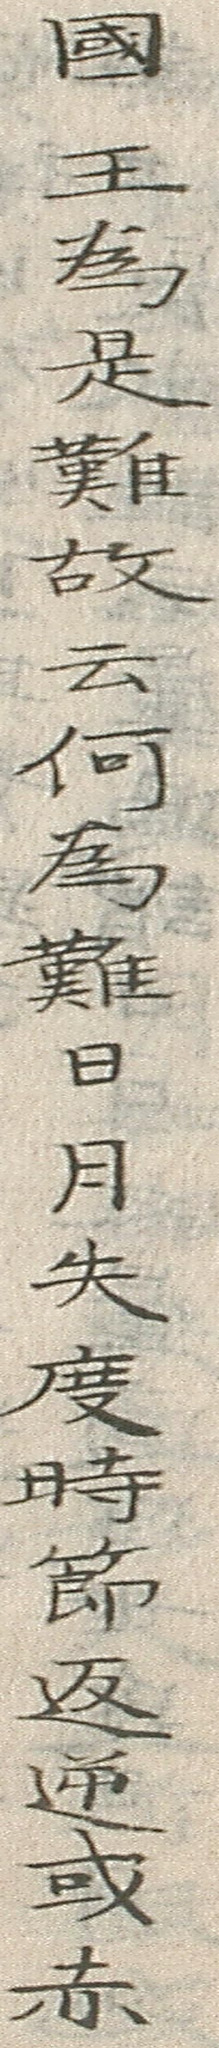国王為是難故云何為難日月失度時節返逆或赤
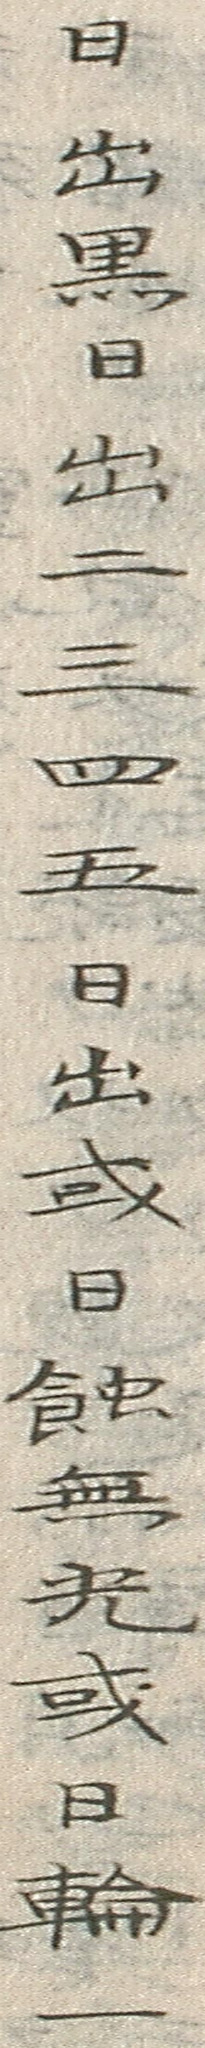日出黒日出二三四五日出或日蝕無光或日輪一
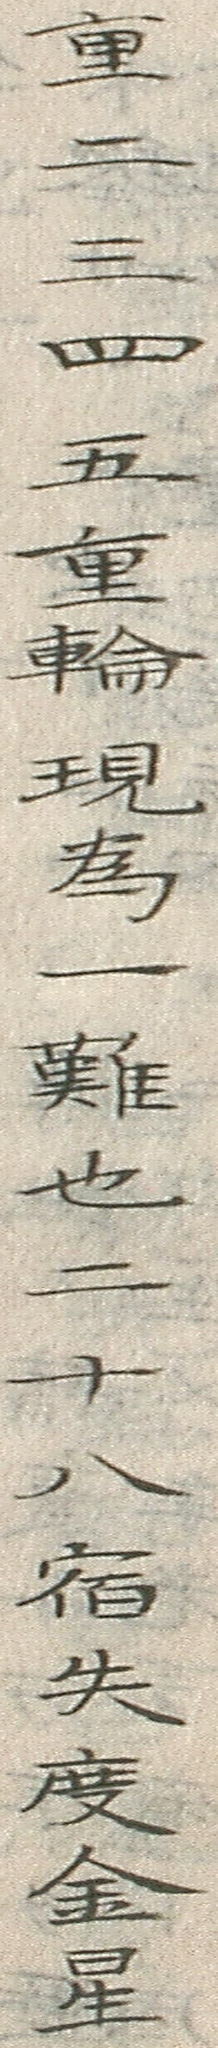重二三四五重輪現為一難也二十八宿失度金星
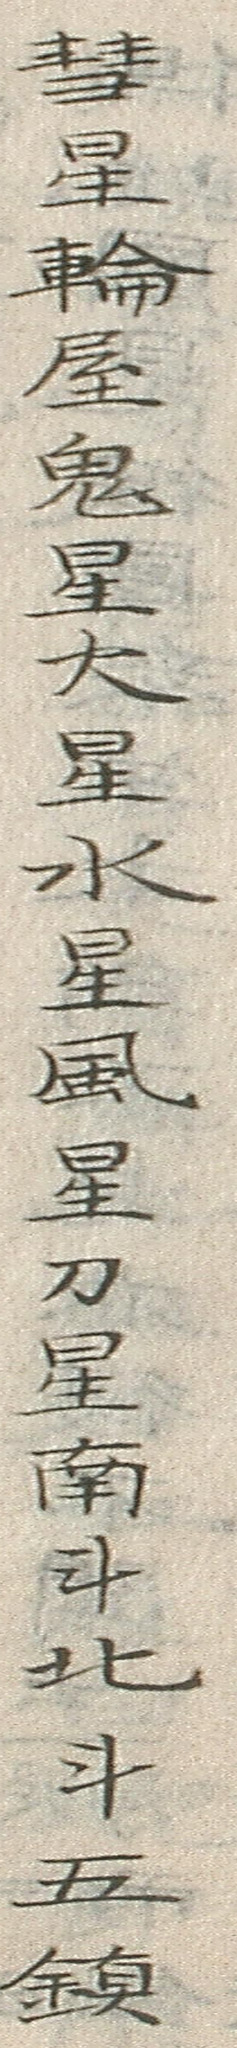彗星輪屋鬼星火星水星風星刀星南斗北斗五鎮
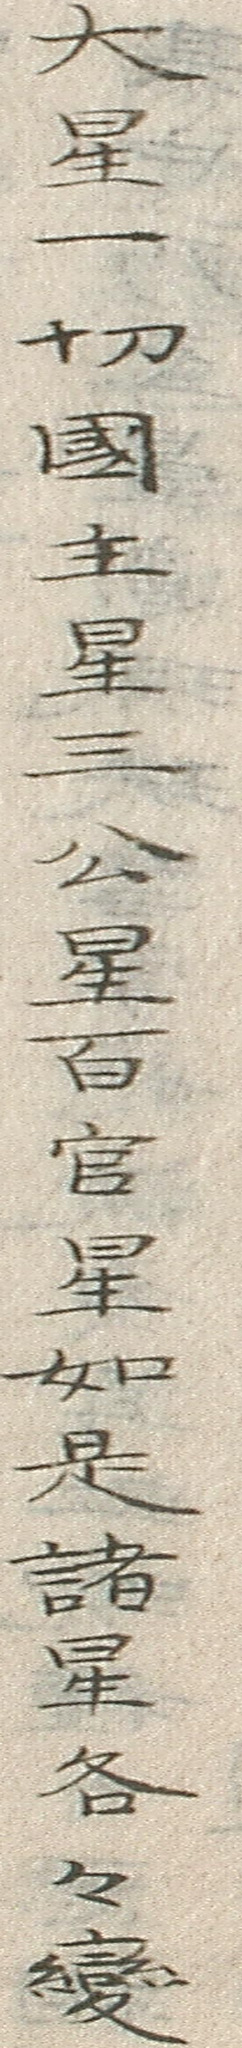大星一切国主星三公星百官星如是諸星各々変
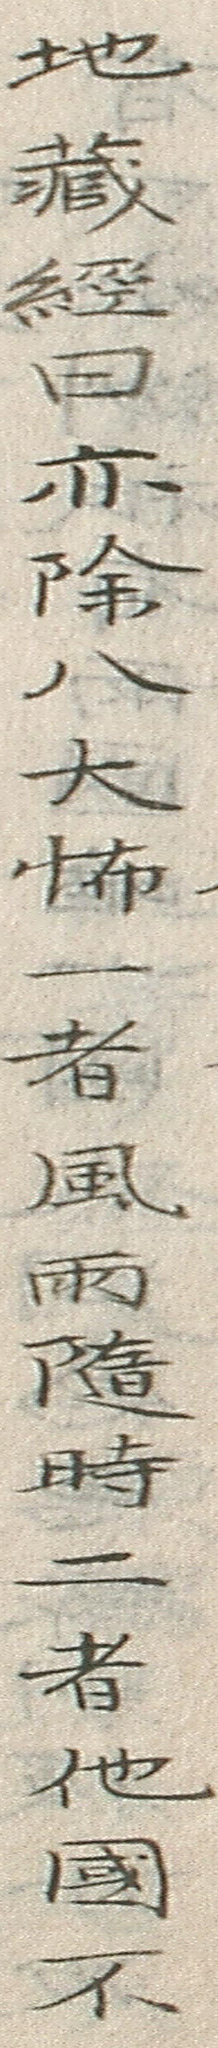地蔵経曰亦除八大怖一者風雨随時二者他国不
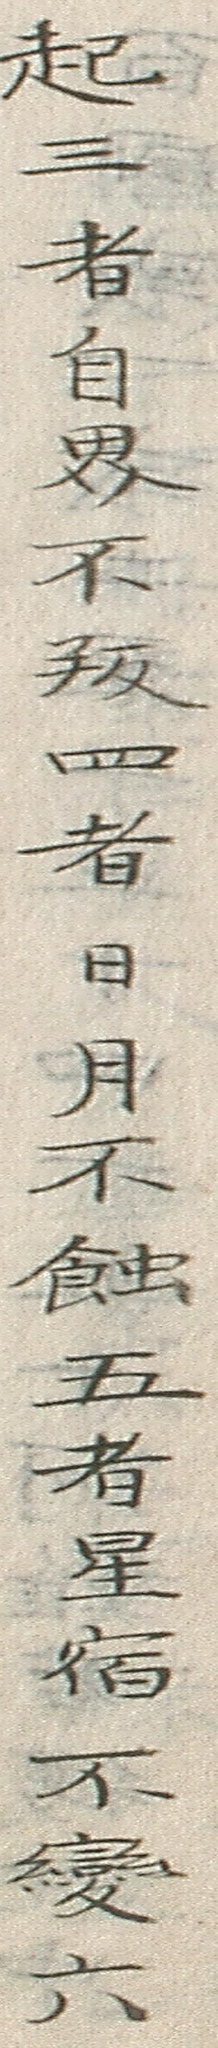起三者自界不叛四者日月不蝕五者星宿不変六
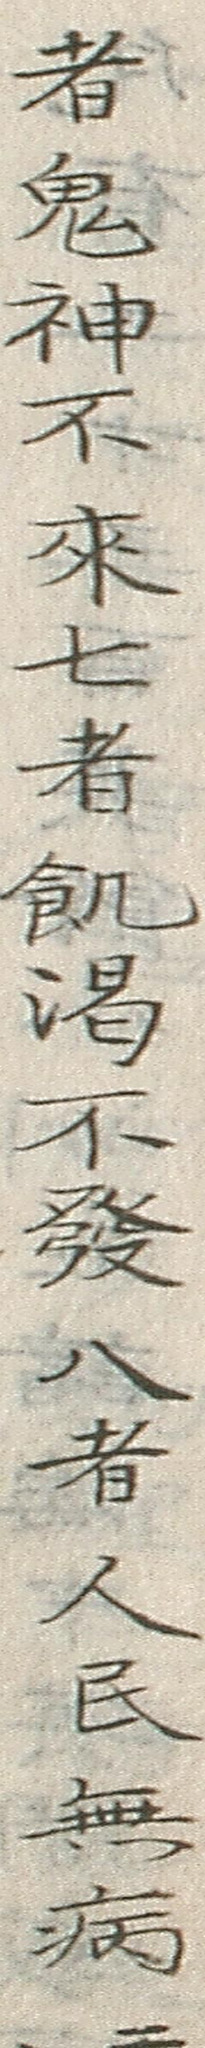者鬼神不来七者飢渇不発八者人民無病云〻
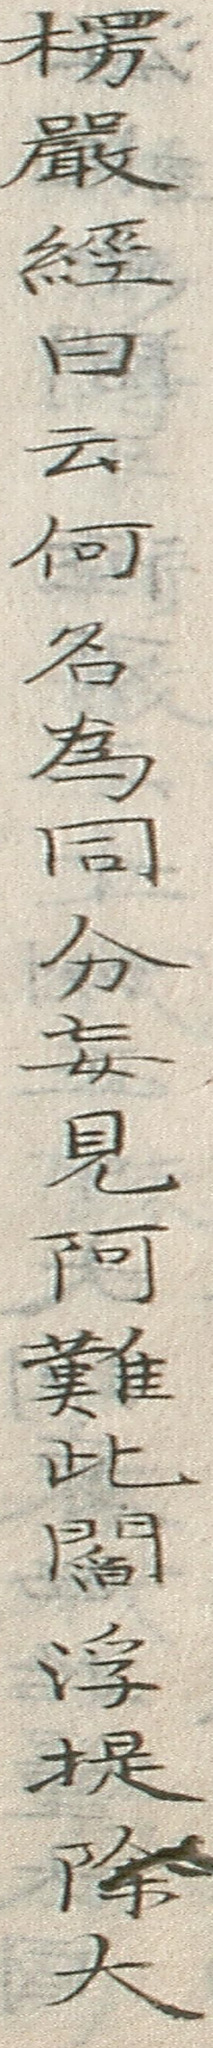楞巌経曰云何名為同分妄見阿難閻浮提除大

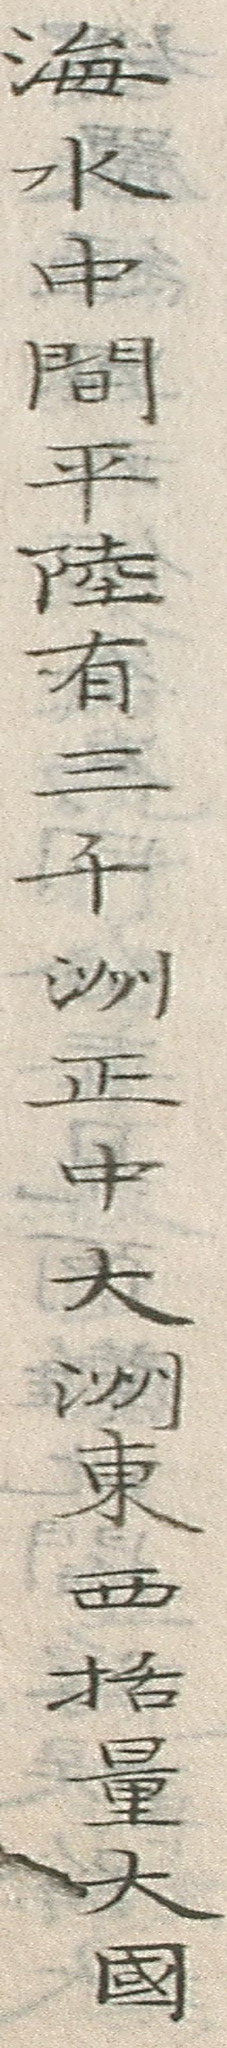海水中間平陸有三千洲正中大洲東西括量大国
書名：天學略名目羽翼　全
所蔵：東京大学地震研究所図書室 Earthquake Research Institute Library, The University of Tokyo, JAPAN
